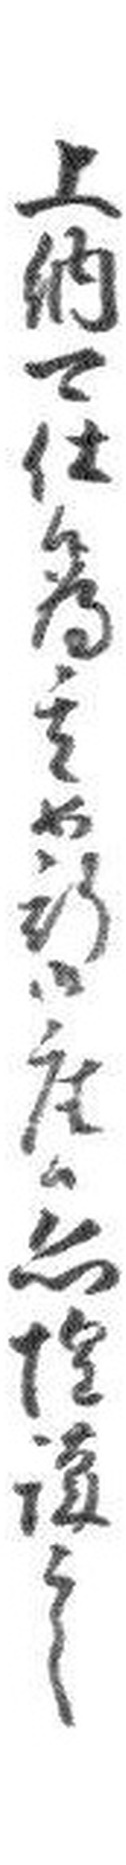上納可仕候為其如斯御座候恐惶謹言
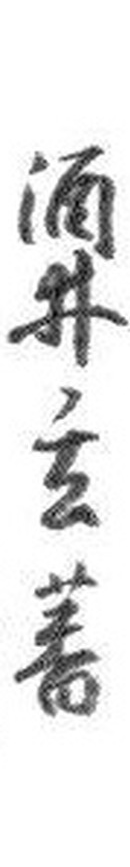酒井玄蕃
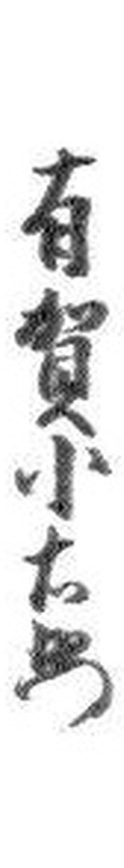有賀小右衛門
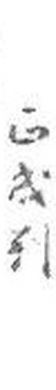正成判
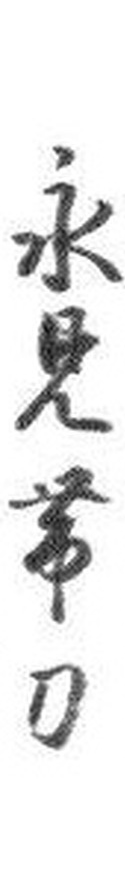永見帯刀
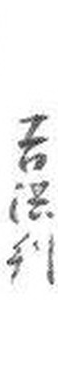吉洪判
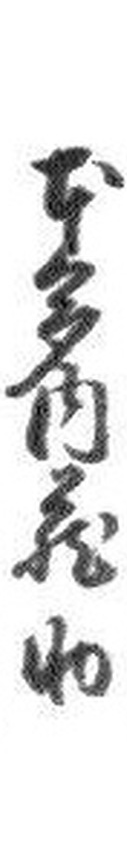本多内蔵助

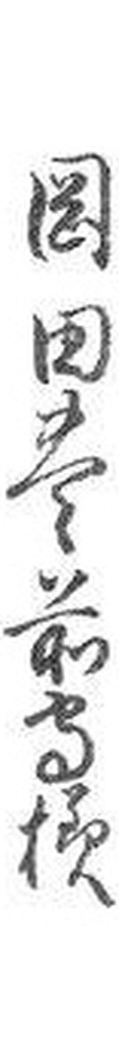岡田豊前守様
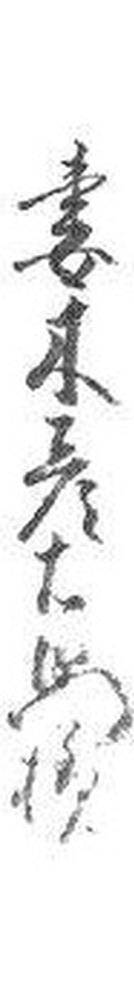妻木彦右衛門様
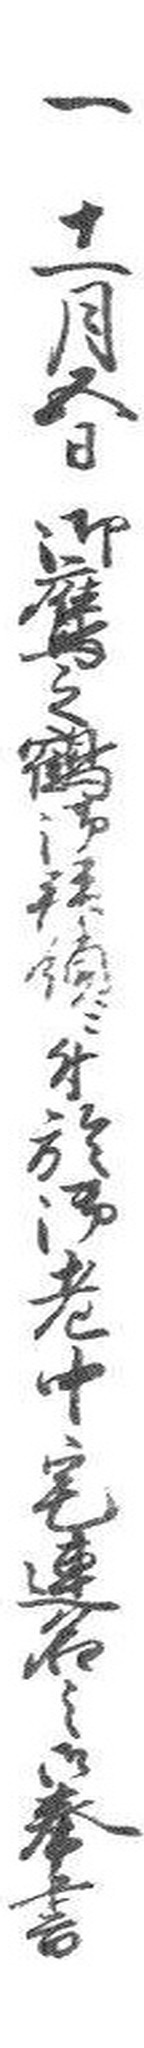一十一月五日御鷹之鶴御拝領ニ付於御老中宅連名之御奉書
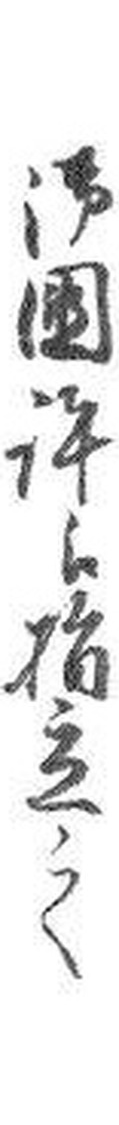御国許江指立之
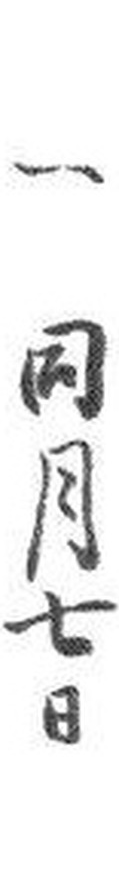一同月七日
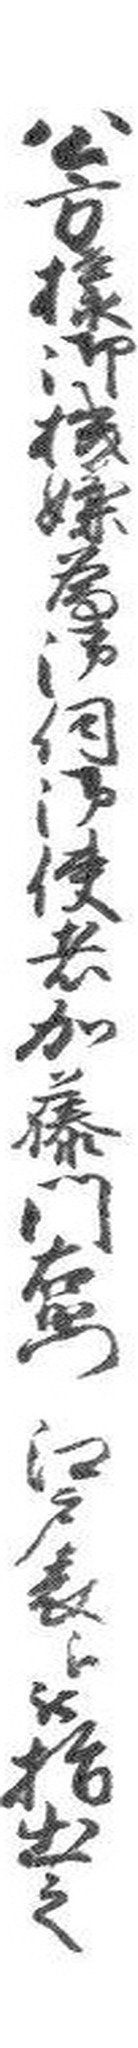公方様御機嫌為御伺御使者加藤門右衛門江戸表江被指出之
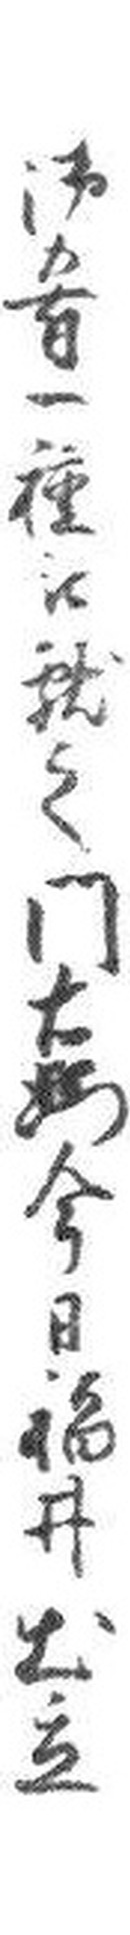御肴一種被献之門右衛門今日福井出立
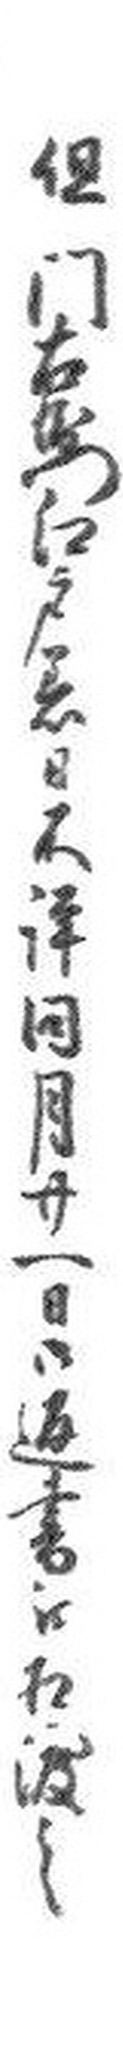但門右衛門江戸着日不詳同月廿一日御返書被相渡之
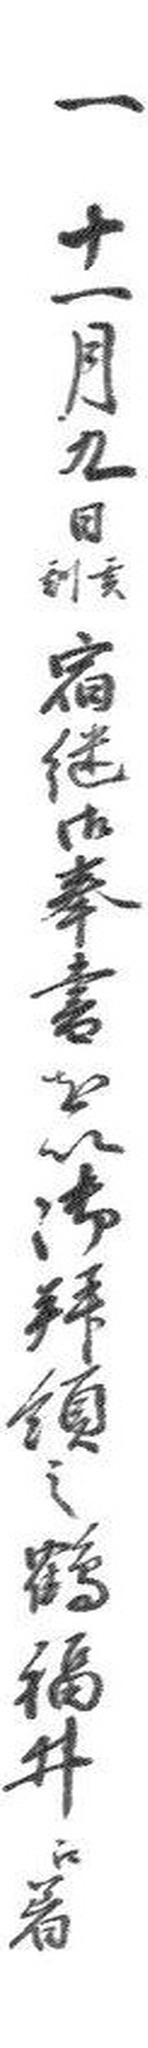一十一月九日亥刻宿継御奉書を以御拝領之鶴福井江着
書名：家譜 七 光通公 従寛文四年到同九年
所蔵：福井県文書館 Fukui Prefectural Archives
